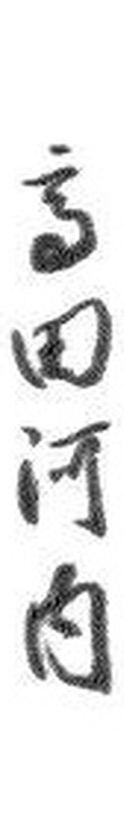高田河内
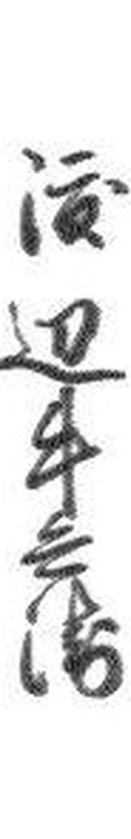渡辺牛兵衛

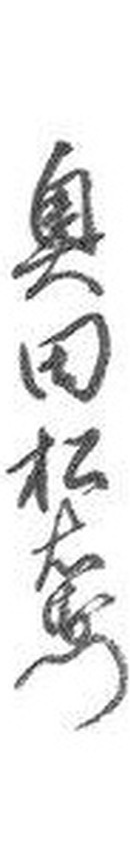奥田松右衛門
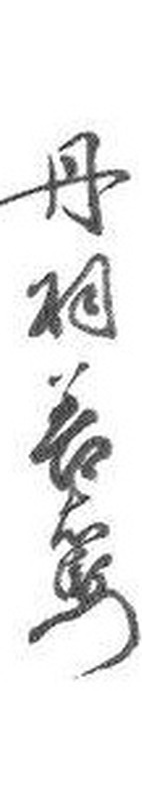丹羽善右衛門
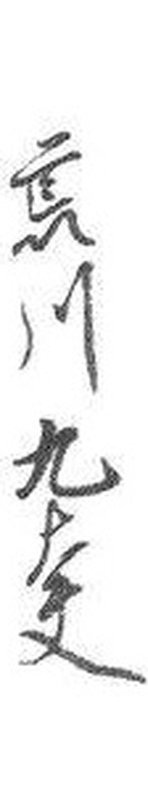荒川九太夫
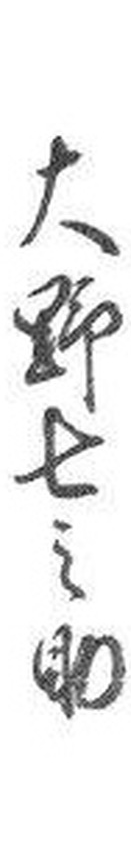大野七之助
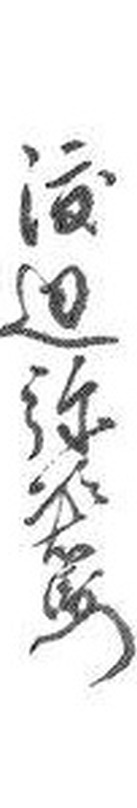渡辺弥次右衛門
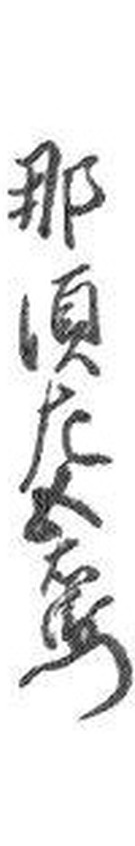那須左五右衛門
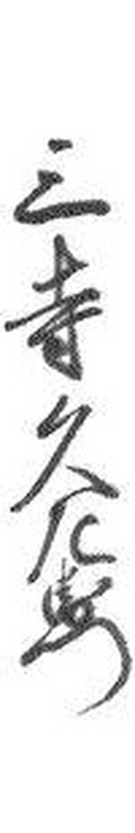三寺久左衛門
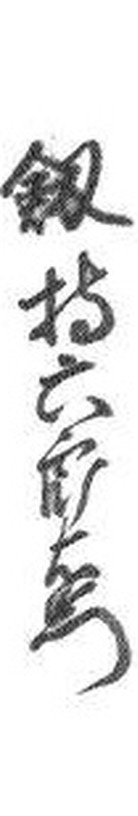剣持六郎右衛門
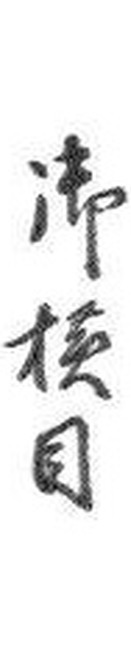御横目
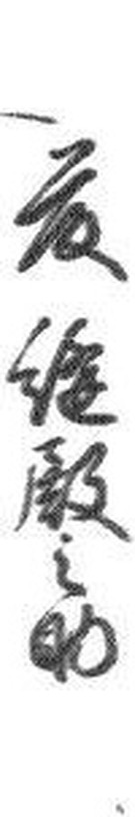藤縫殿之助
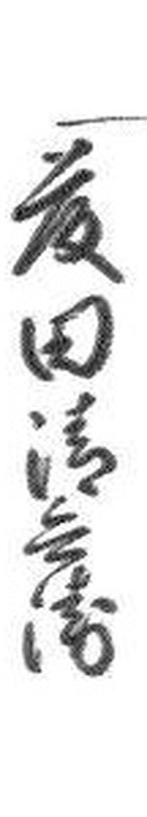藤田清兵衛
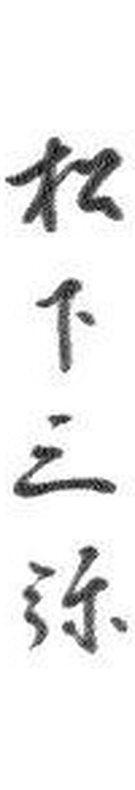松下三弥
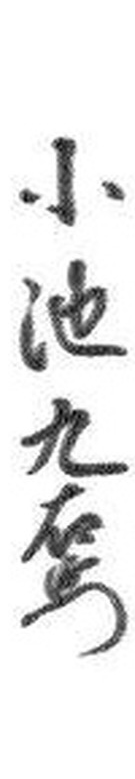小池九右衛門
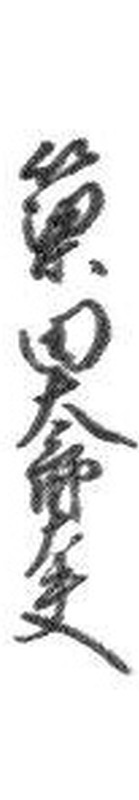簗田太郎太夫
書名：家譜 四 忠昌公 従寛永七年到正保四年
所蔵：福井県文書館 Fukui Prefectural Archives
